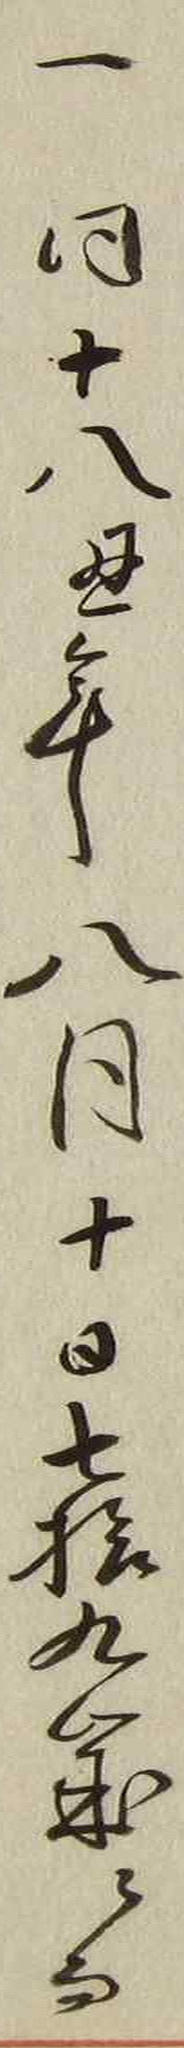一同十八丑年八月十日七拾九歳ニ而
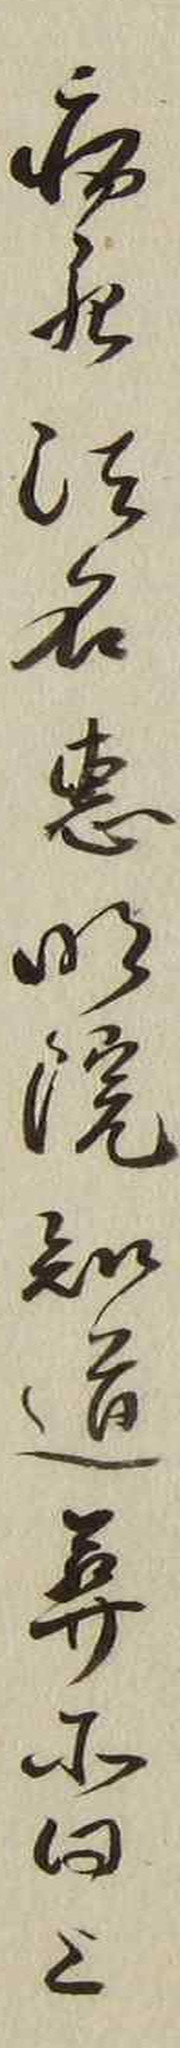病死法名恵明院知道葬所同上

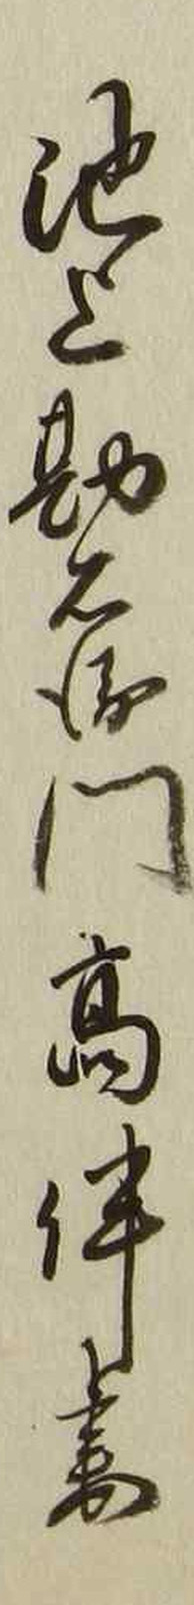女池上勘右衛門高伴妻
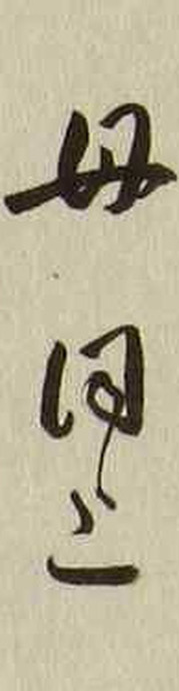母同上
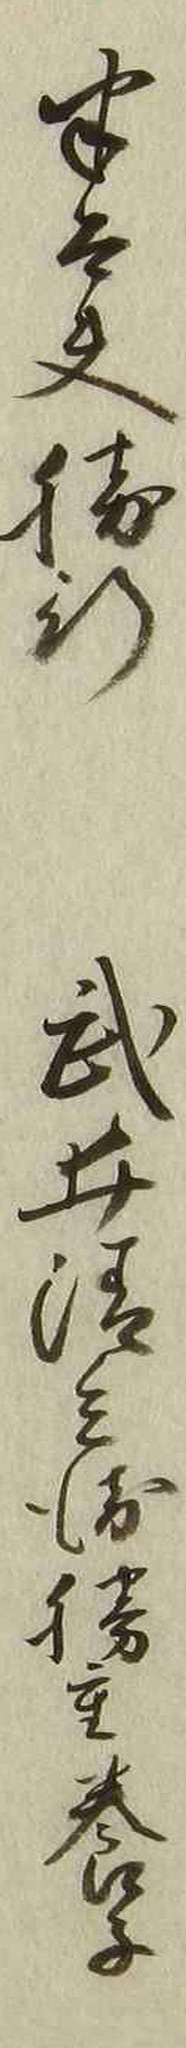半太夫勝行武井清兵衛勝重養子
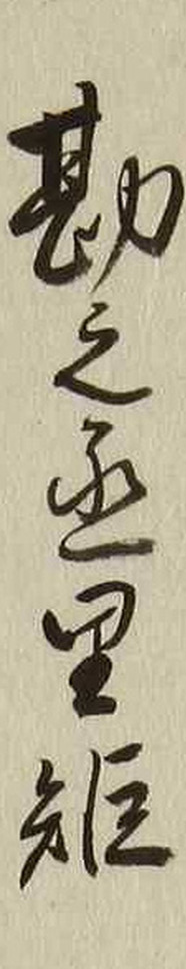勘之丞里矩
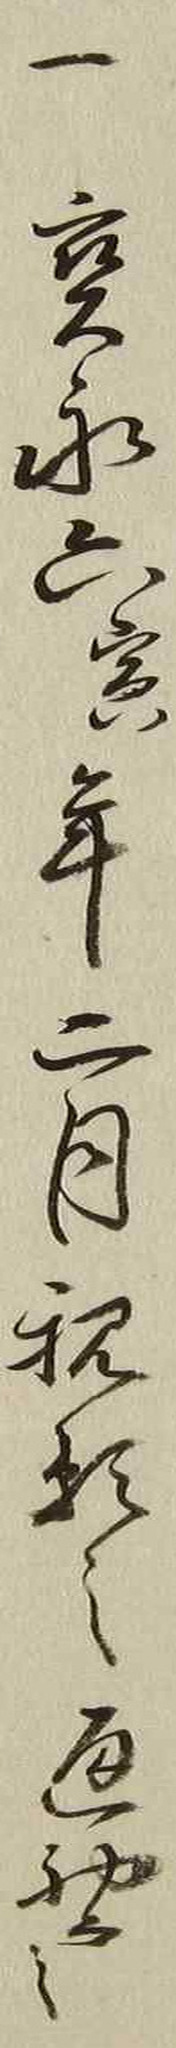一宝永六寅年二月親願之通初而之
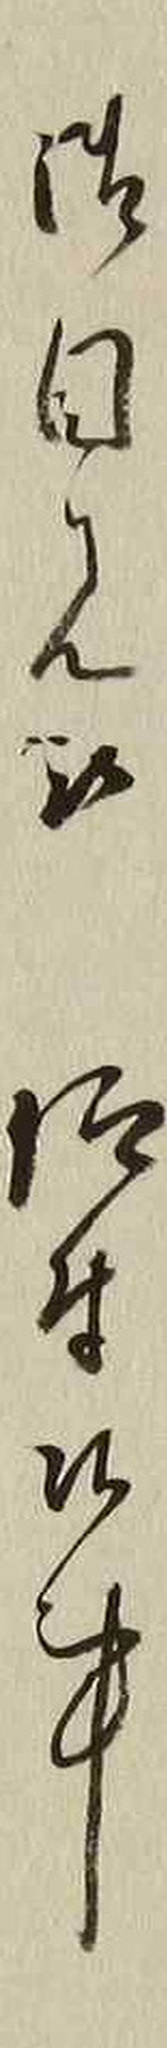御目見被仰付候事
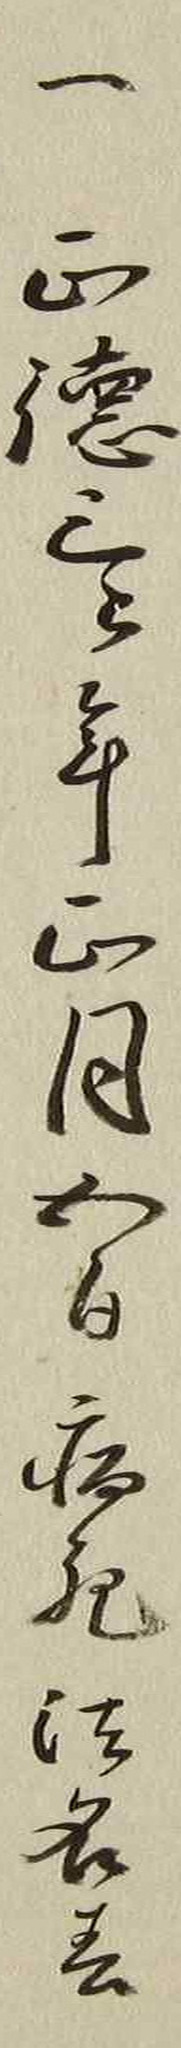一正徳三巳年正月五日病死法名春
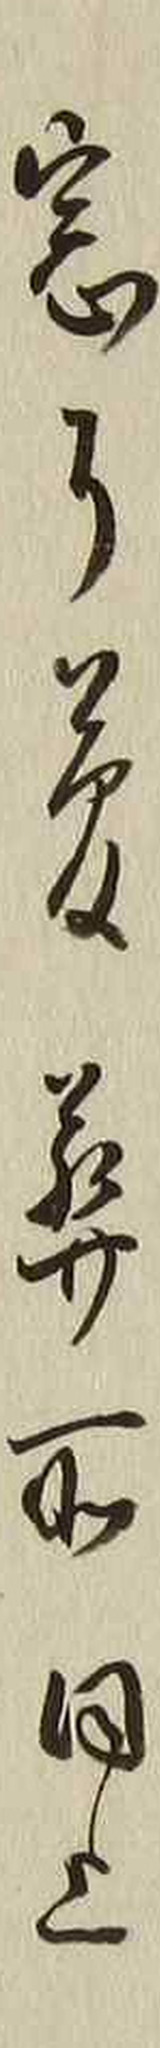窓了夢葬所同上
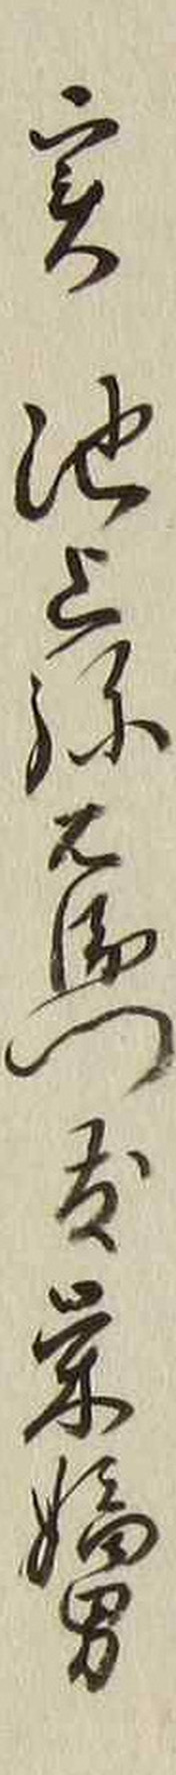実池上孫右衛門友栄嫡男
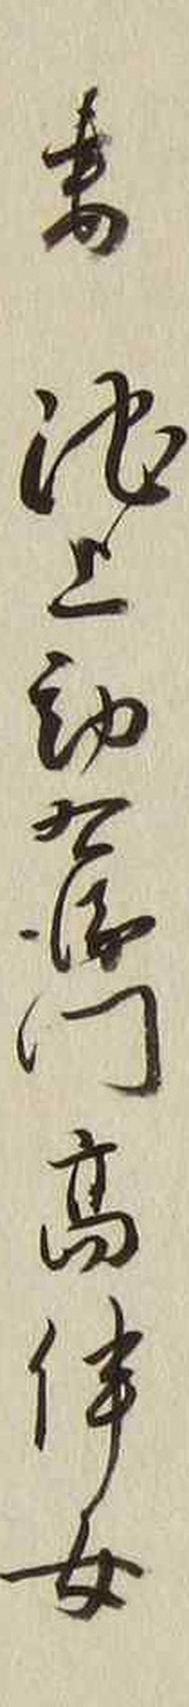女池上勘右衛門高伴妻
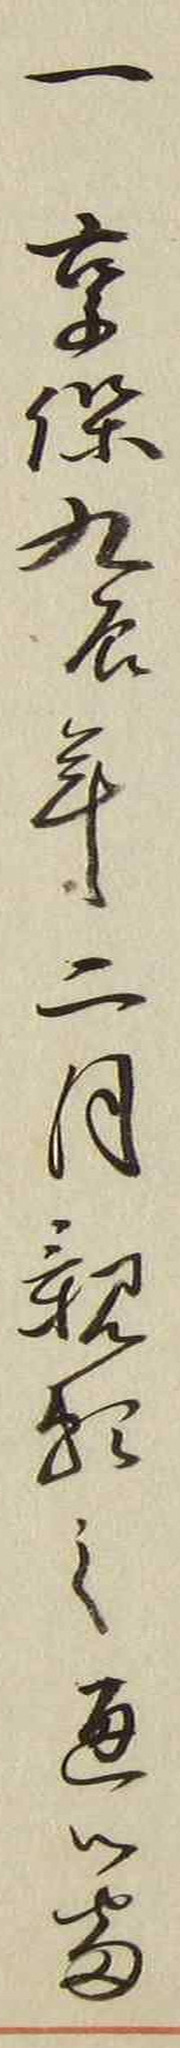一享保九辰年二月親願之通御番

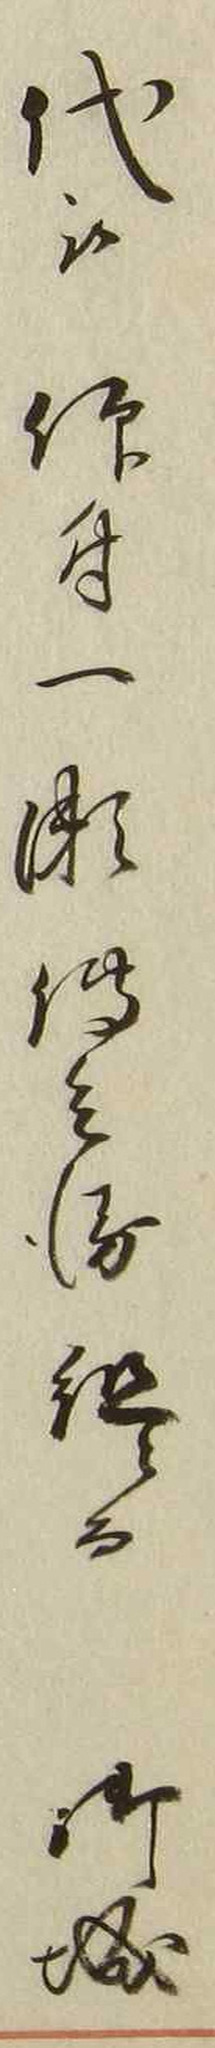代被仰付一瀬伝兵衛組ニ而御城
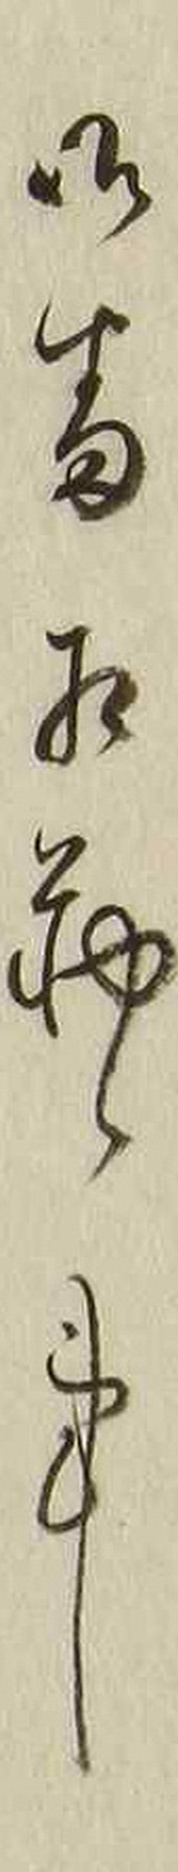御番相勤候事
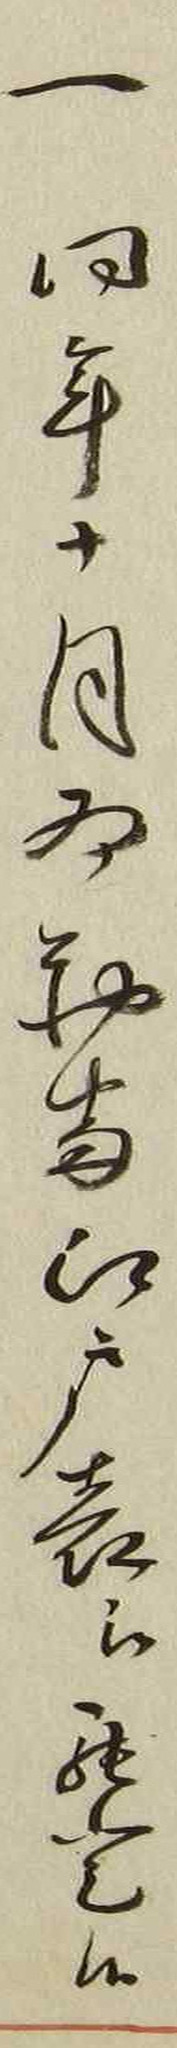一同年十月為勤番江戸表江罷登候
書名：諸士系譜　巻之26　い之部26
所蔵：会津若松市立会津図書館
